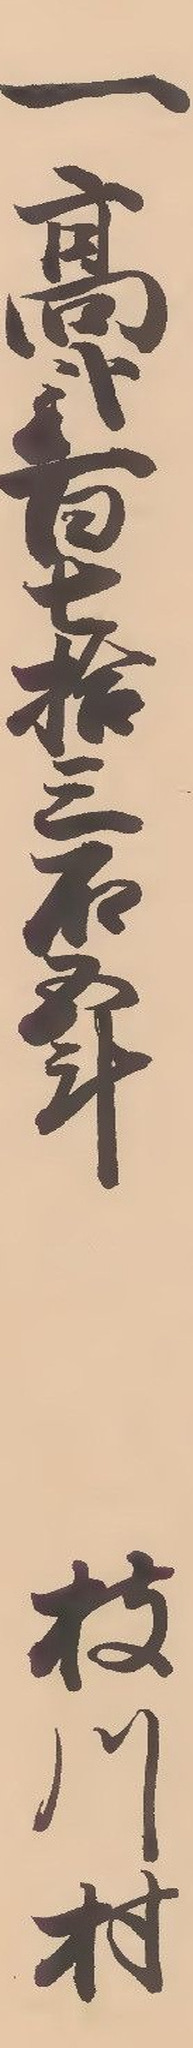一高弐百七拾三石五斗枝川村
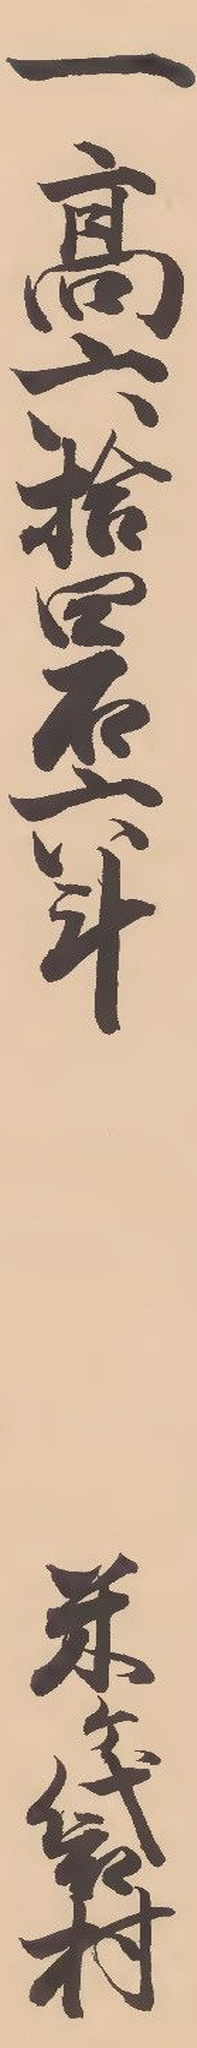一高六拾四石六斗米ヶ袋村
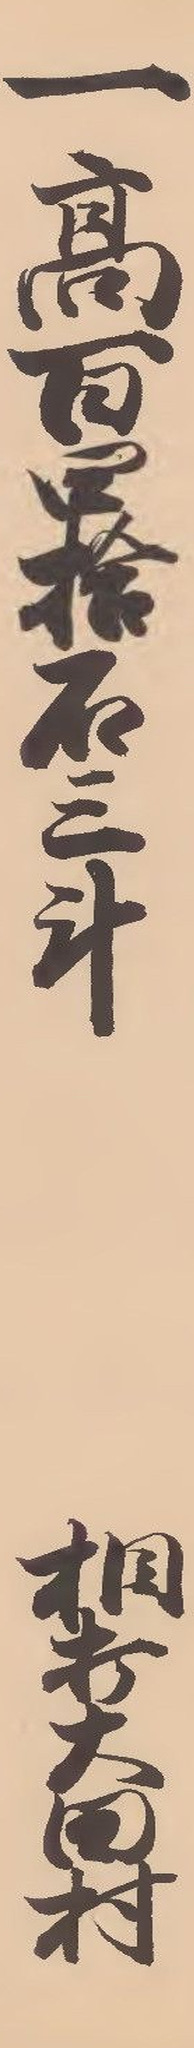一高百四拾石三斗相打大田村

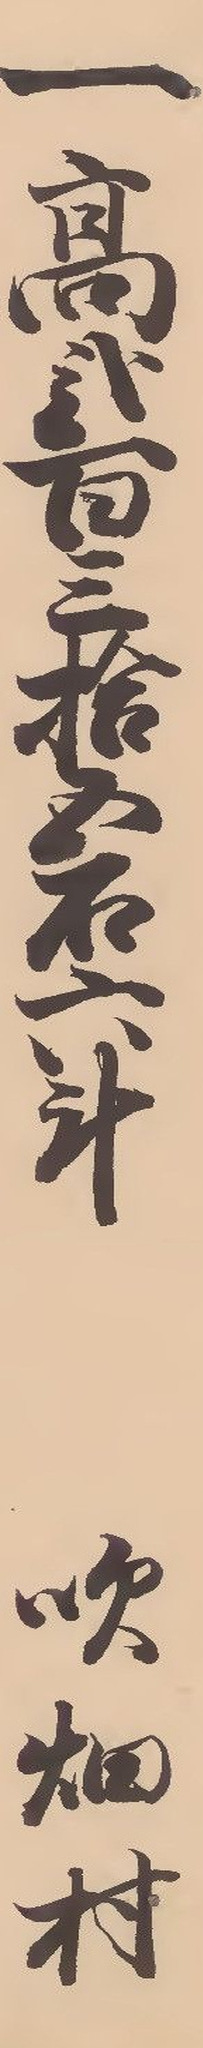一高弐百三拾五石六斗吹畑村
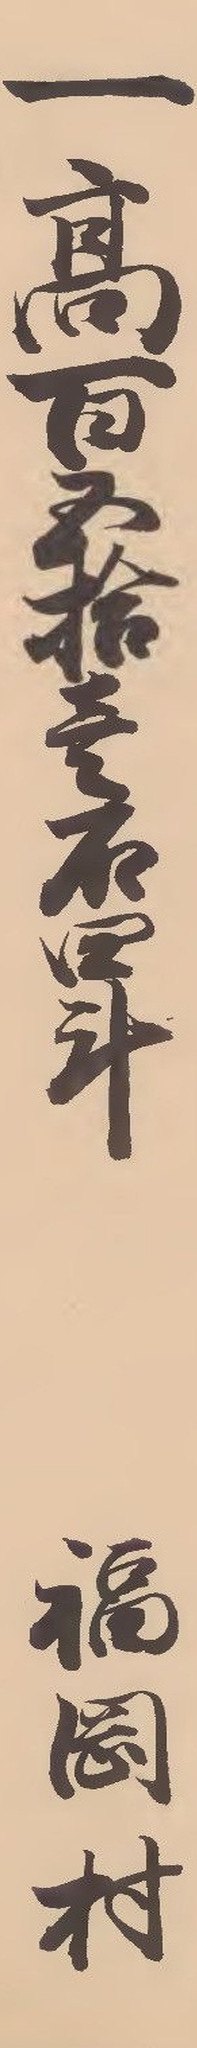一高百五拾壱石四斗福岡村
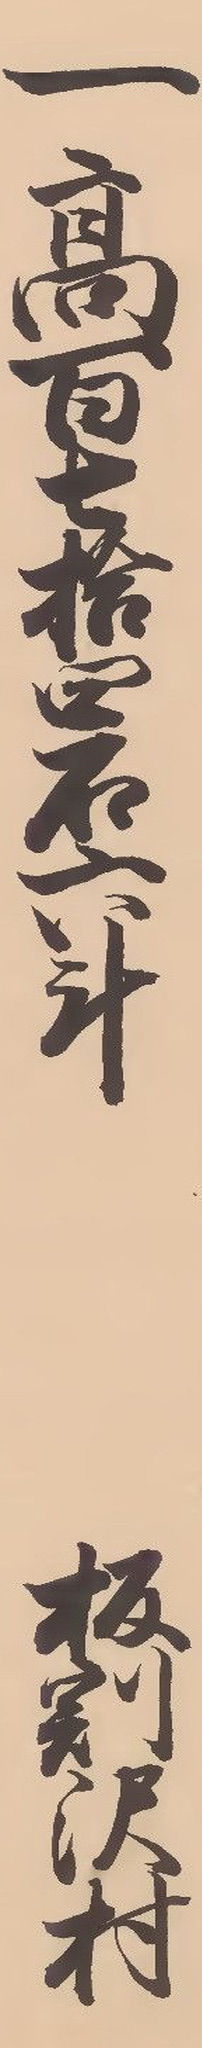一高百七拾四石六斗板割沢村
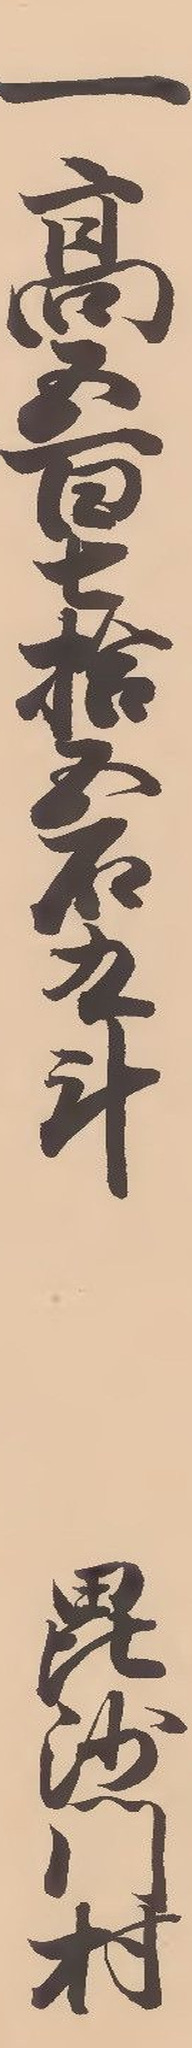一高五百七拾五石九斗毘沙門村
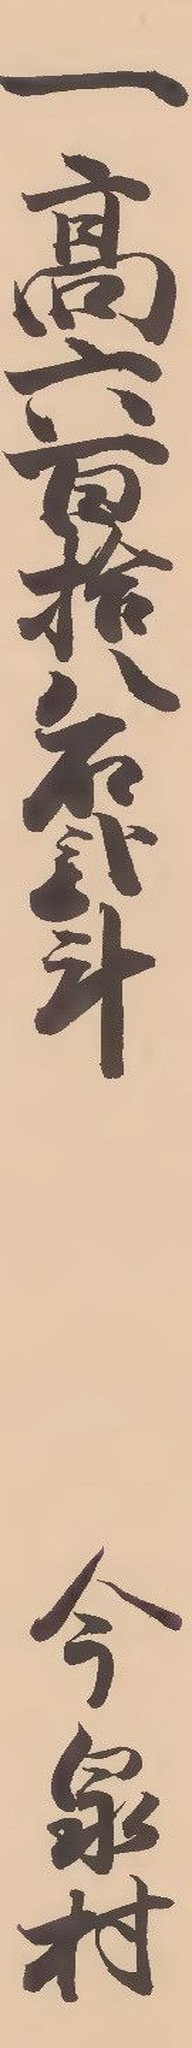一高六百拾八石弐斗今泉村
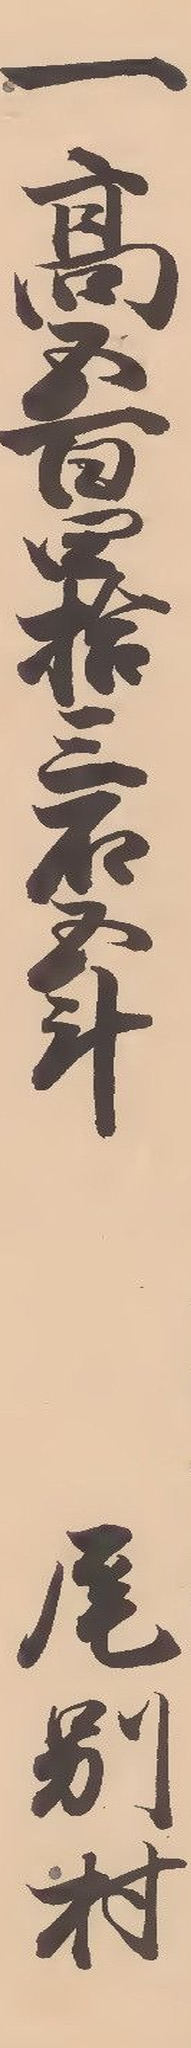一高五百四拾三石五斗尾別村

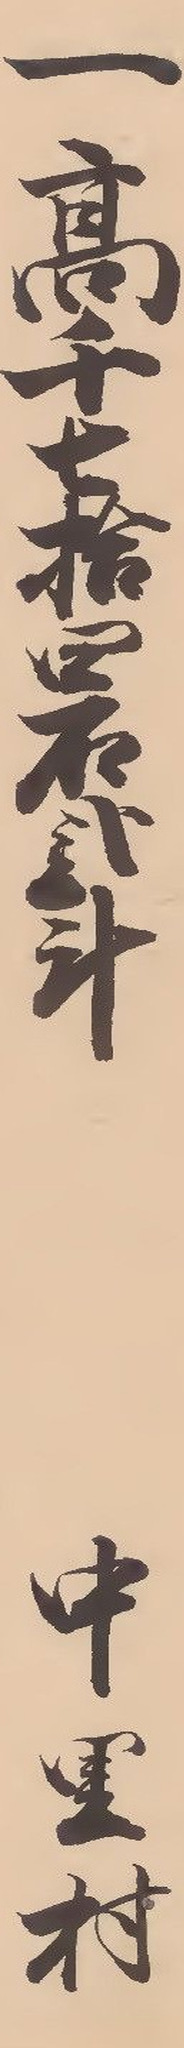一高千七拾四石弐斗中里村
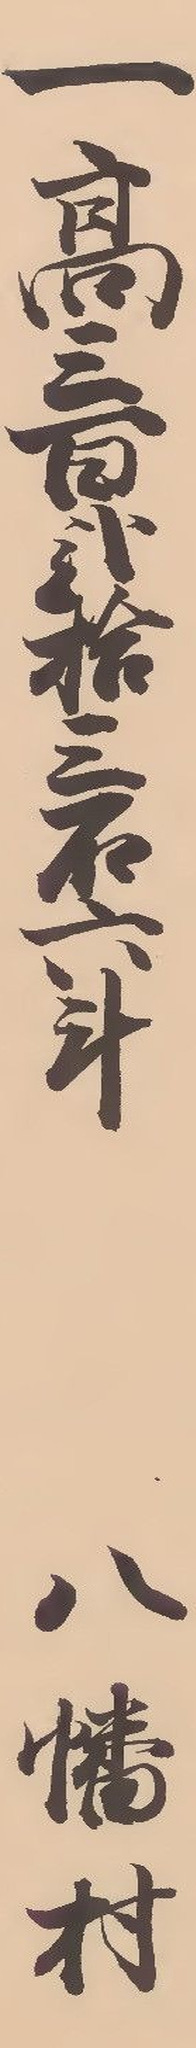一高三百弐拾三石六斗八幡村
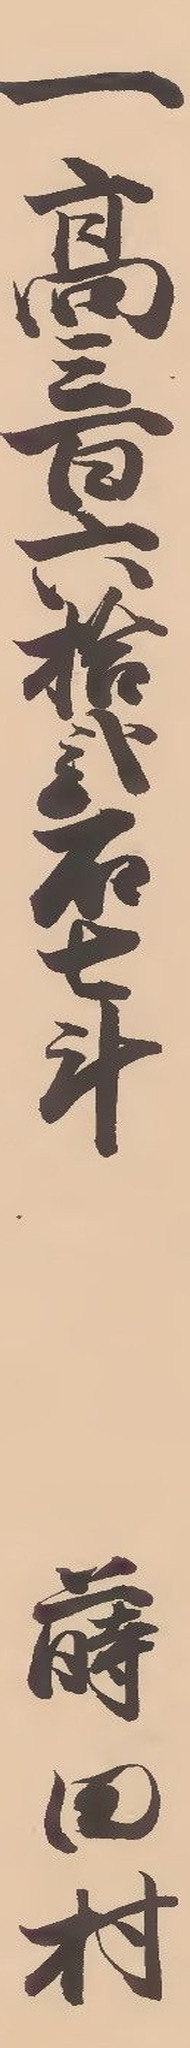一高三百六拾弐石七斗蒔田村
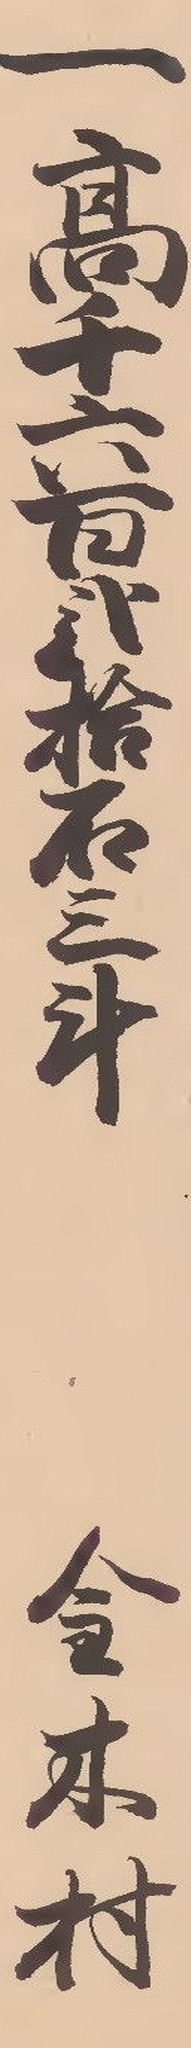一高千六百弐拾石三斗金木村
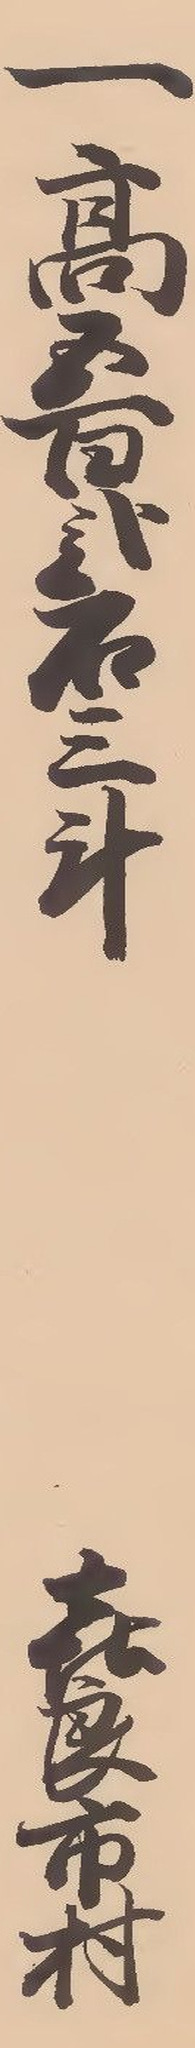一高五百弐石三斗喜良市村
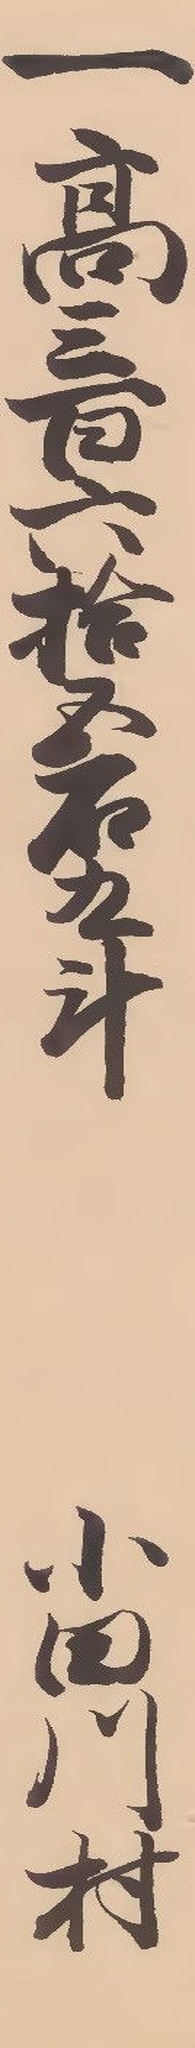一高三百六拾五石九斗小田川村
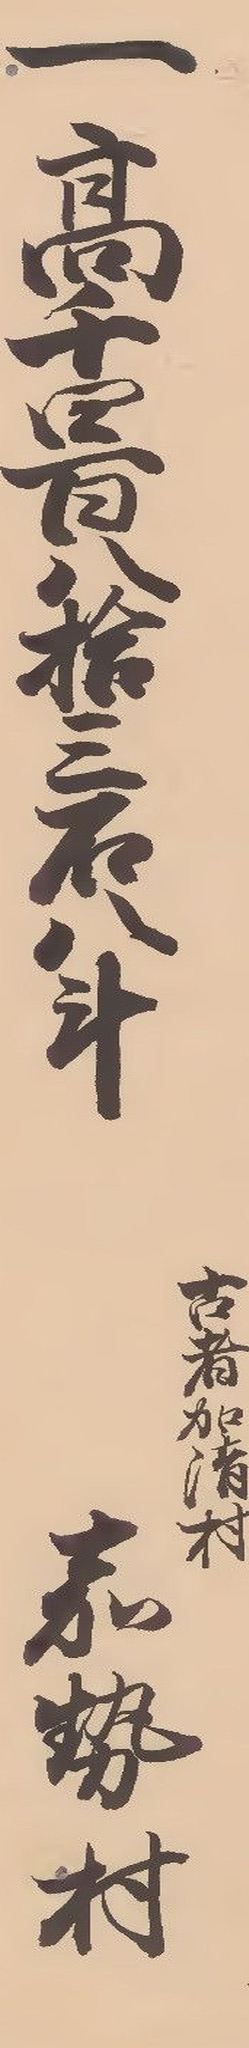一高千四百八拾三石八斗嘉勢村
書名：陸奥国郷帳　７
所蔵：国立公文書館 National Archives of Japan
